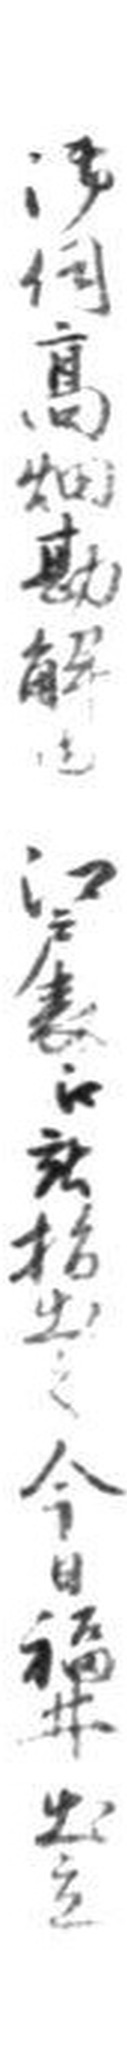御伺高畑勘解由江戸表江被指出之今日福井出立
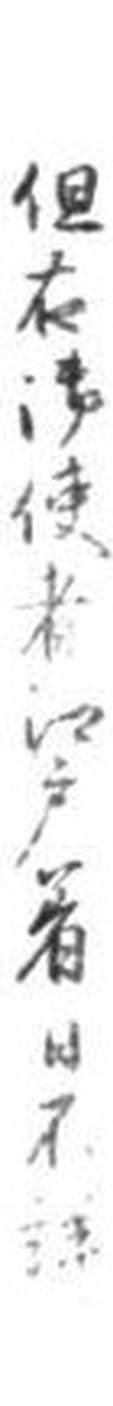但右御使者江戸着日不詳
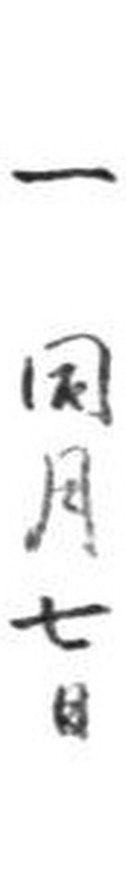一同月七日
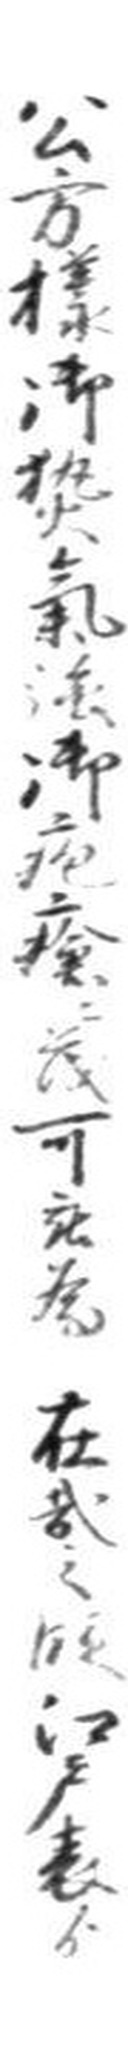公方様御熱気強御疱瘡ニも可被為在哉之段江戸表ゟ
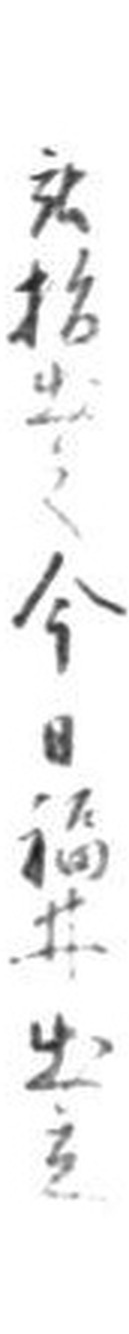被指出之今日福井出立
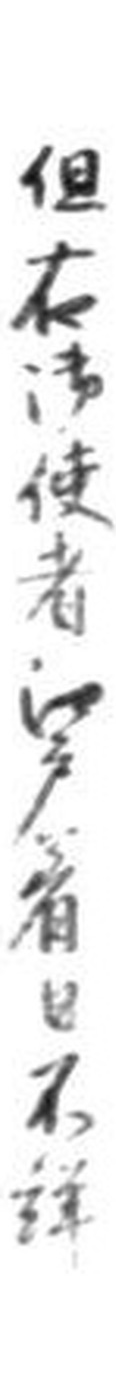但右御使者江戸着日不詳
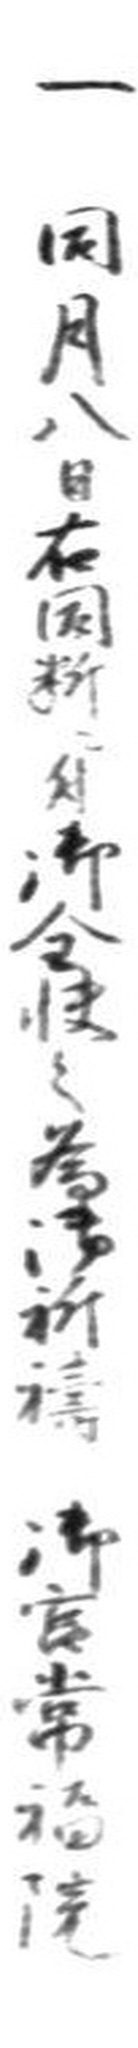一同月八日右同断ニ付御全快之為御祈祷御宮常福院
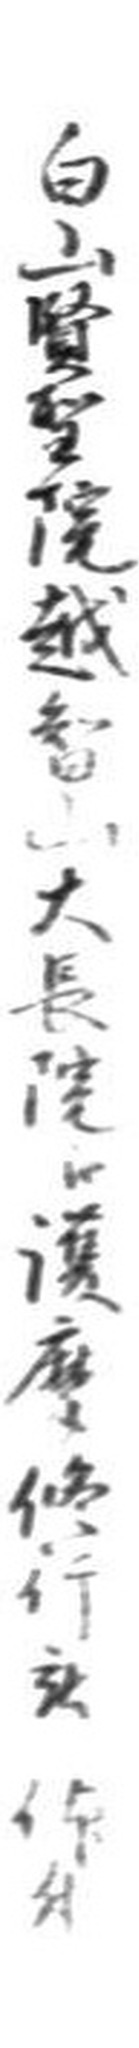白山賢聖院越智山大長院江護摩修行被仰付
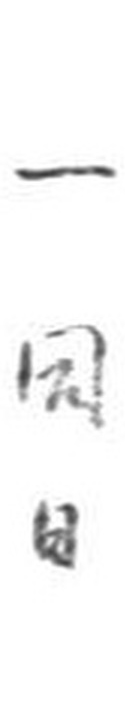一同日
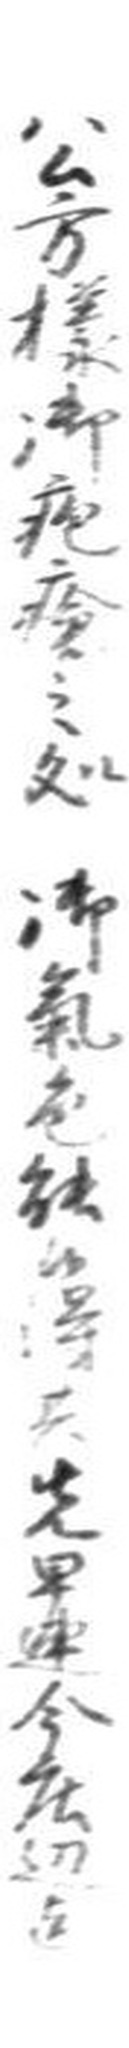公方様御疱瘡之処御気色能候得共先早速今庄辺迄
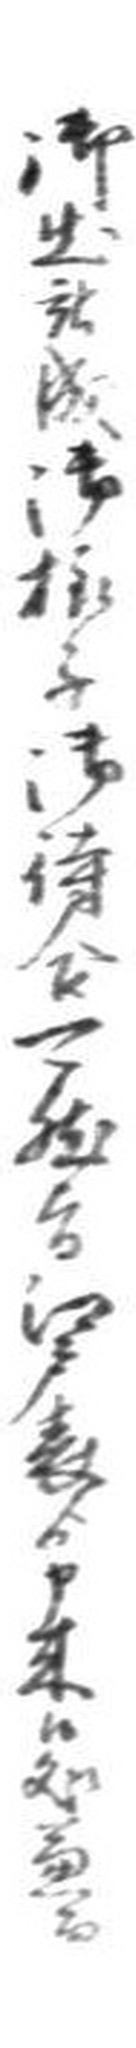御出被成御様子御待合可然旨江戸表ゟ申来候処兼而
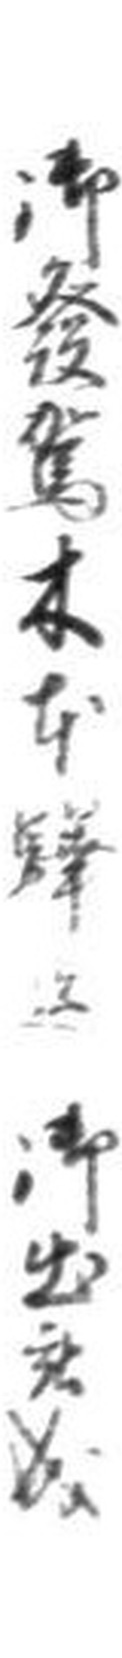御発駕木本駅迄御出被成
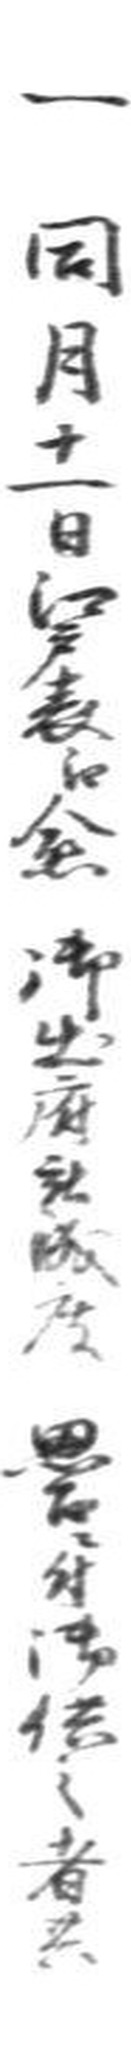一同月十一日江戸表江愈御出府被成度思召ニ付御供之者共

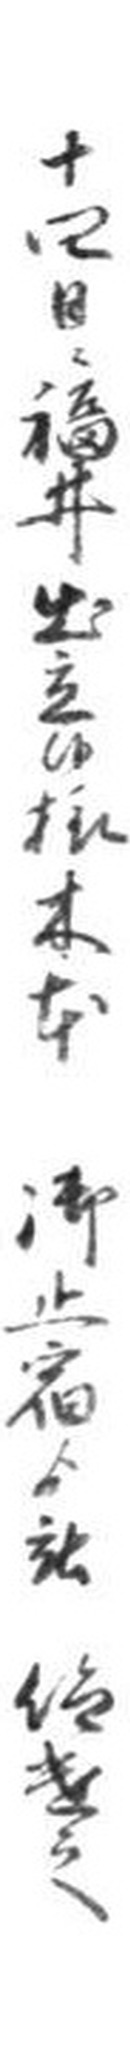十四日ニ福井出立候様木本御止宿ゟ被仰遣之
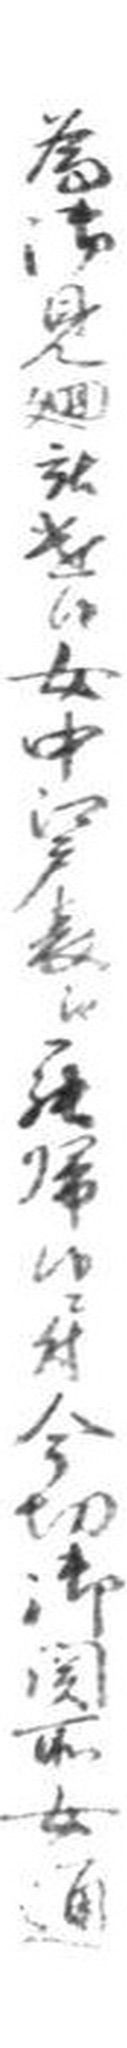為御見廻被遣候女中江戸表江罷帰候ニ付今切御関所女通
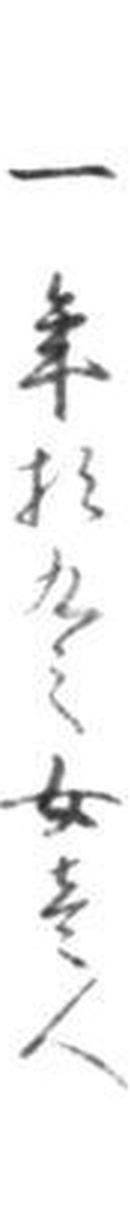一年拾九之女壱人
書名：家譜 三 忠昌公 従慶長八年到寛永六年
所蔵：福井県文書館 Fukui Prefectural Archives
